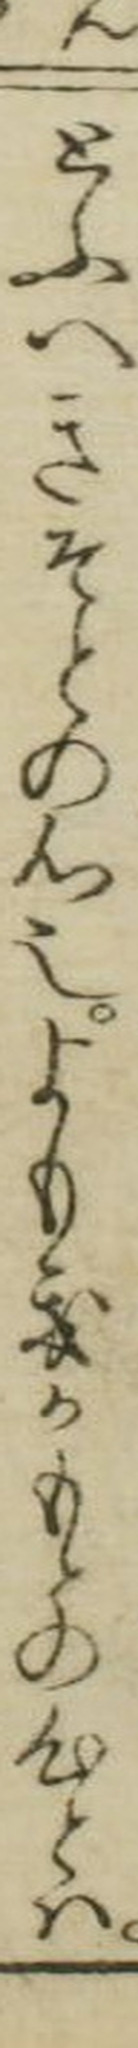とふへきそとの心也。よもきかもとの心とは。
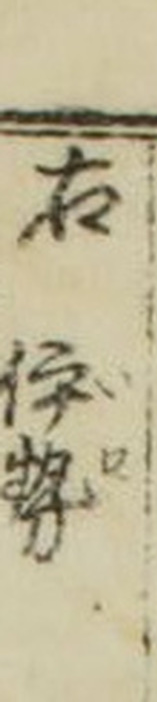右伊勢
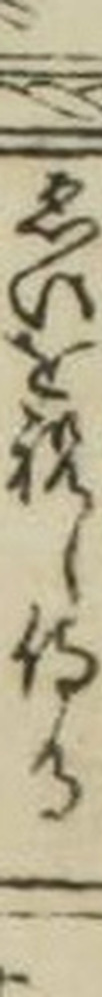ゑいを祝し侍る
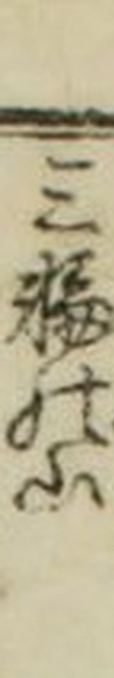三輪の山
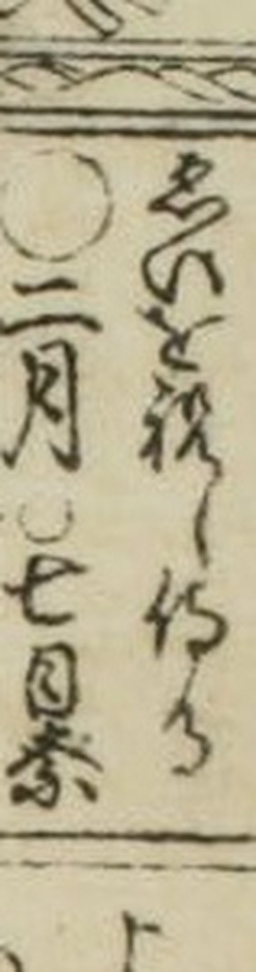○二月○七日奈
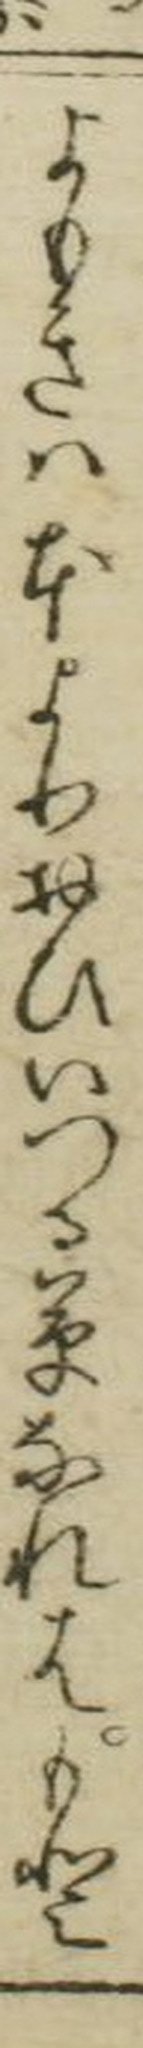よもきは本よりおひいつる草なれは。もと
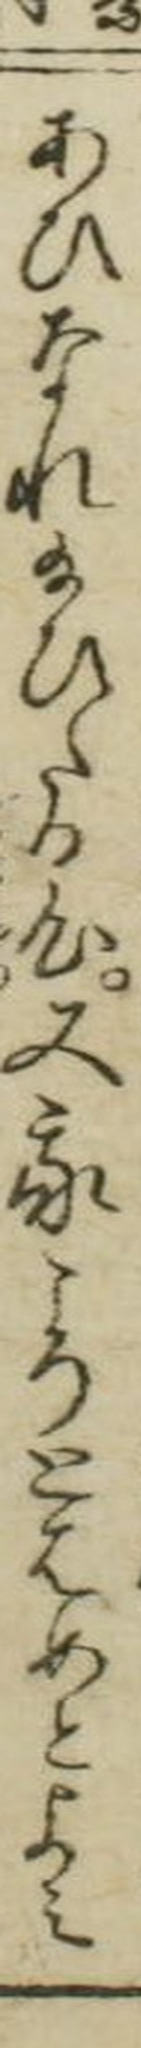あひなれ給ひたる心。又我こそとはめとよみ
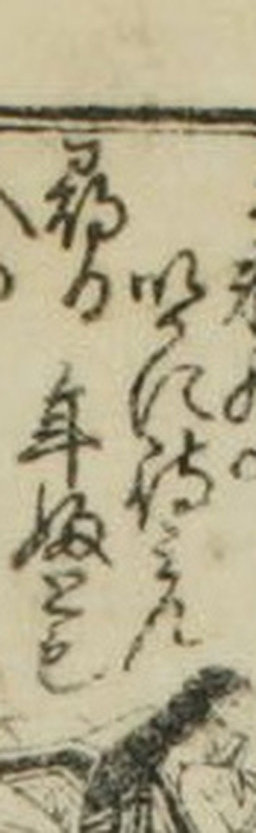尋る年ふとも
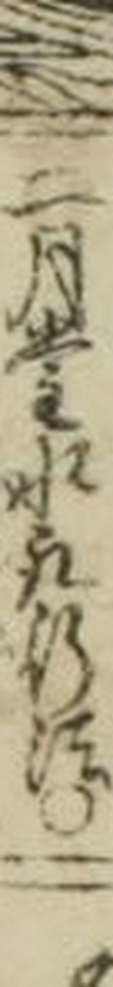二月堂水取行法○
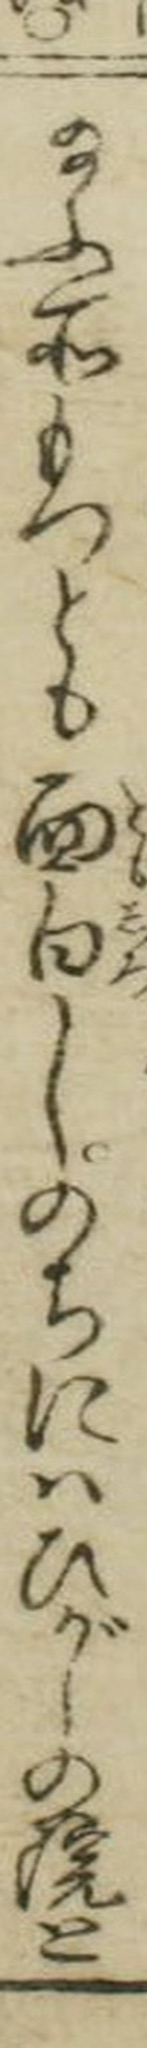給ふ所もつとも面白し。のちにはひがしの院と
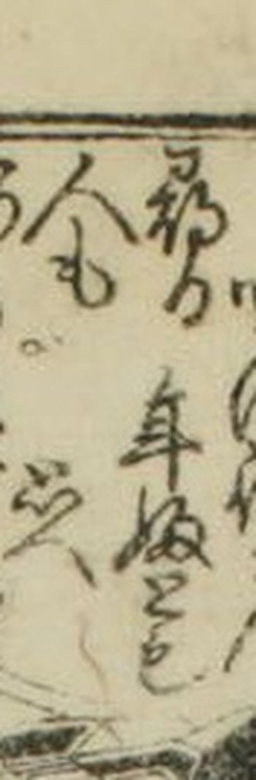人も思へ
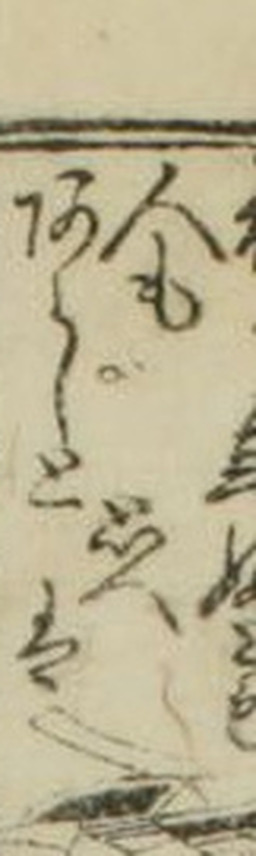あらじとは
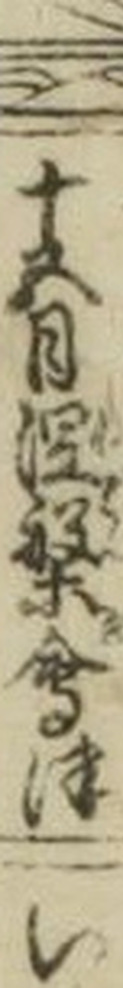十五日涅槃会津
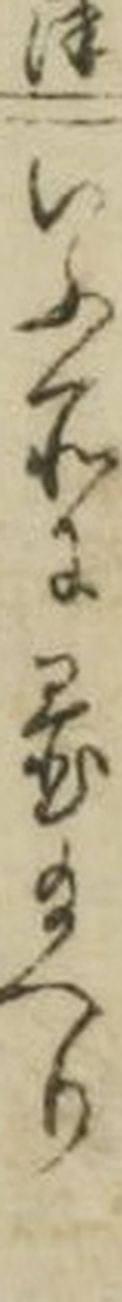いふ所に置給へり
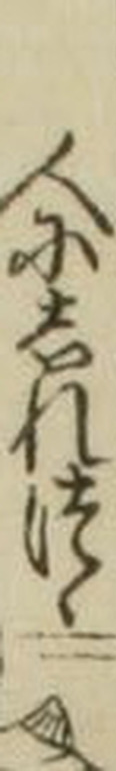人にしれつゝ
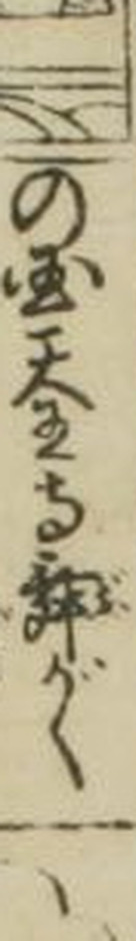の国天王寺舞がく
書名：女源氏教訓鑑
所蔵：東京学芸大学附属図書館
